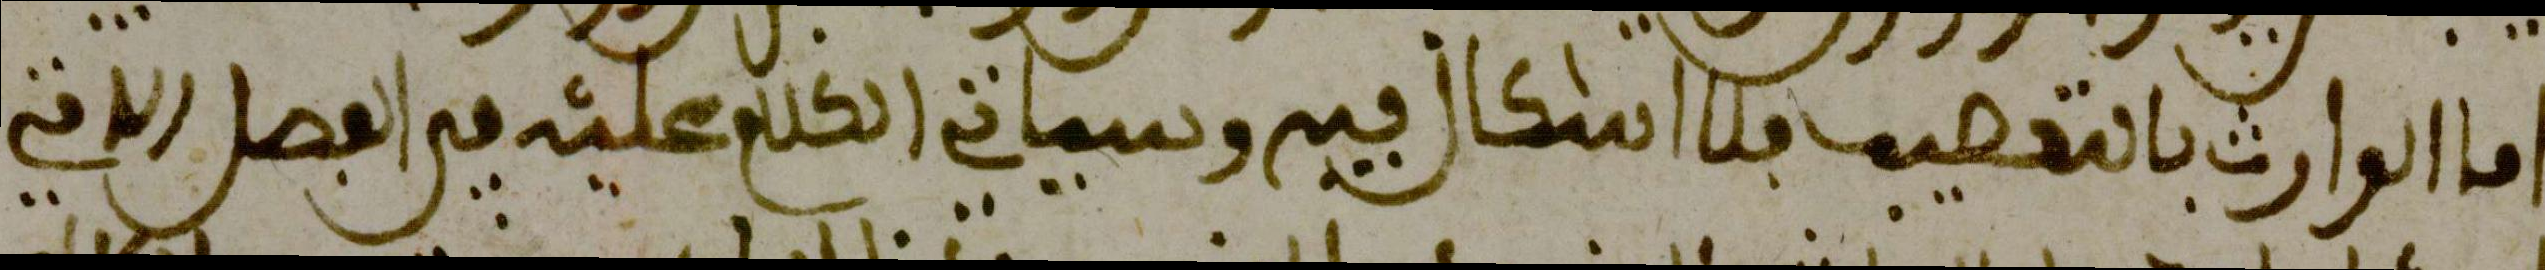اما الوارث بالتعصيب فلا اشكال فيه وسياتي الكلام عليْه في الفصل الاتي
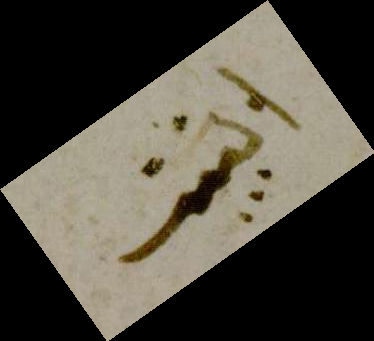البيت
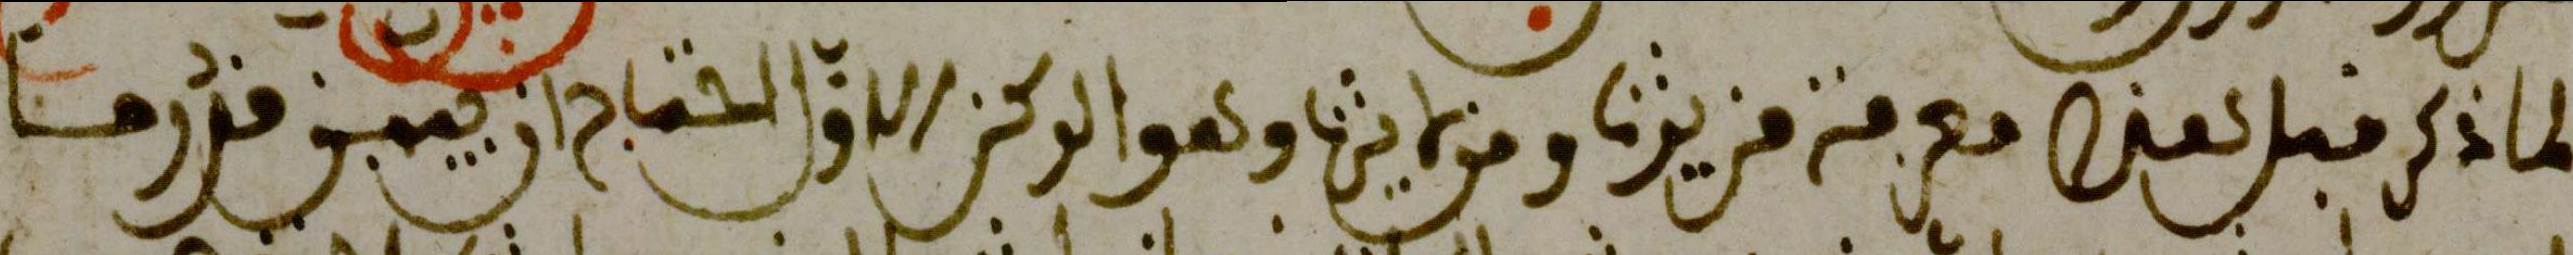لما ذكر قبل هذا معرفة من يرث ومن لا يرث وهو الركن الاوّل احتاج ان تبين قدر ما
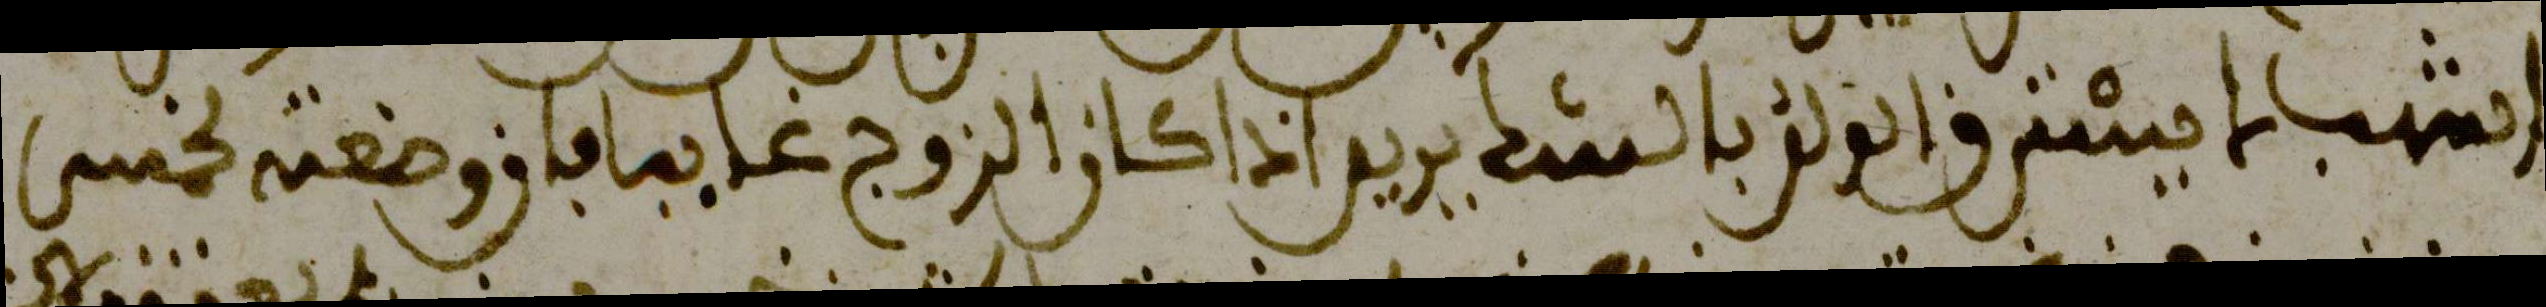اشهب لا يسترق الولد بالشك يريد اذا كان الزوج غائبا فان وضعته لخمس
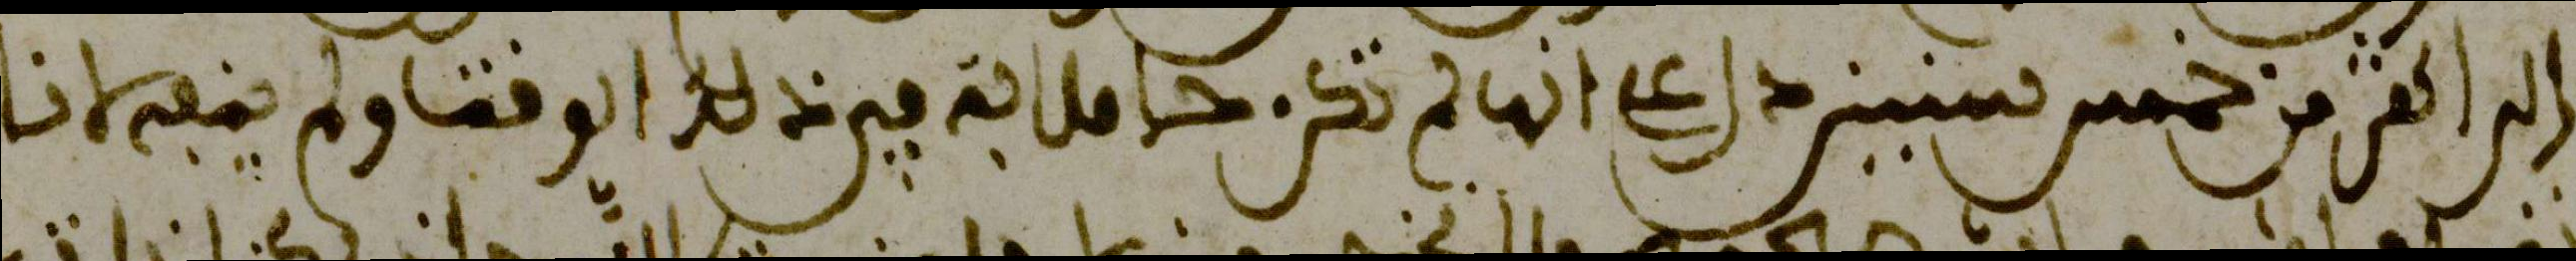الى اكثر من خمس سنين دل على انها لم تكن حاملا به في ذلك الوقت ولم ينفه لانا
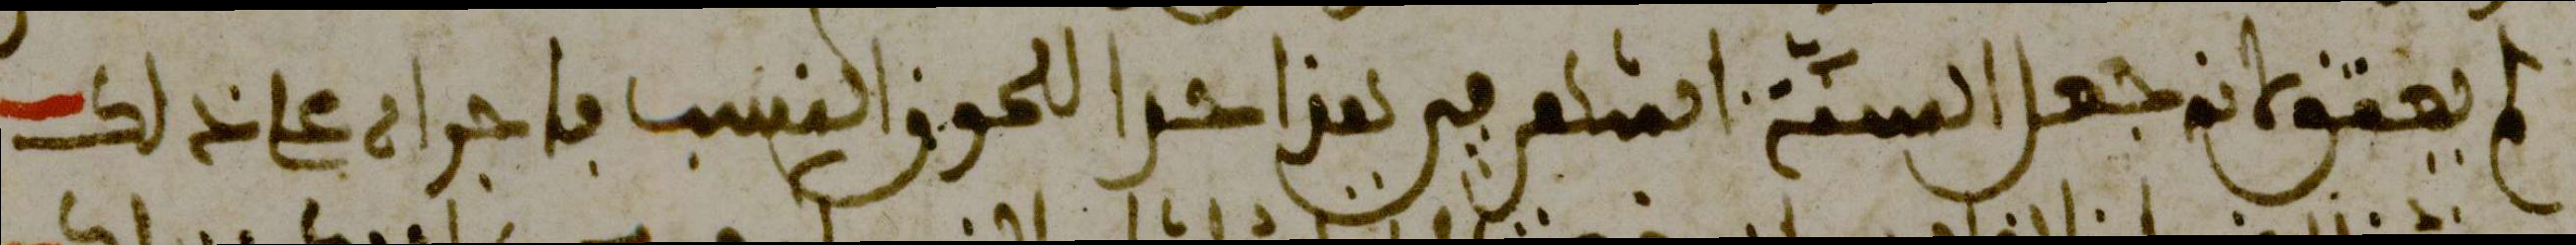لم يعتق لانه جعل الستة اشهر في هذا حد اللحوق النسب فاجراه على ذلك
